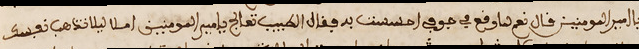يا امير المومنين قال نعم لما وقع في جوفى احسست به فقال الطبيب تعالج يا امير المومنين املا ليلا تذهب نفسك
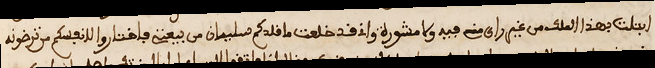ابتلت بهذا الملك من غير راى منى فيه ولا مشورة وانى قد خلعت ما قلدكم سليمان من بيعتى فاختار وا لانفسكم من ترضونه
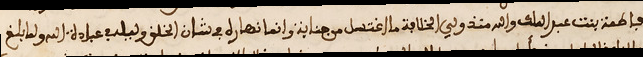فاطمة بنت عبد الملك والله منذ ولي الخلافة ما اغتسل من جنابة وانما نهاره في شان الخلق وليله في عبادة الله ولما بلغ
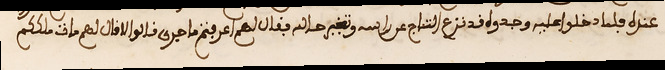عنده فلما دخلوا عليه وجدوه قد نزع التاج عن راسه وتغير حاله فقال لهم اعرفتم ماجرى قالوا لا قال لهم مات ملككم
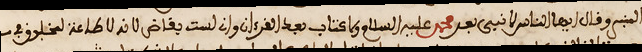المنبر وقال ايها الناس لا نبى بعد محمد عليه السلام ولا كتاب بعد القرءان وانى لست بقاض لانه لاطاعة لمخلوق في
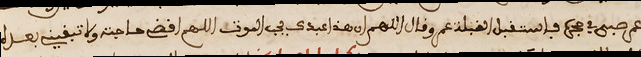عمر صبى في حجره فاستقبل القبلة عمر وقال اللهم ان هذا عبدك يحب الموت اللهم اقضى حاجته ولا تبقني بعده
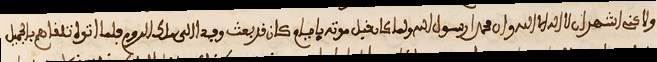ولاكنى اشهد ان لا اله الا الله وان محمدا رسول الله ولما كان فبل موته بايام كان قد بعث وفدا الى ملك الروم فلما اتوه تلقاهم بالجميل
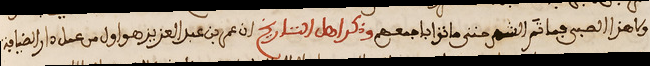ولا هذا الصبى فما تم الشهر حتى ماتوا باجمعهم وذكر اهل التاريخ ان عمر بن عبد العزيز هو اول من عمل دار الضيافة
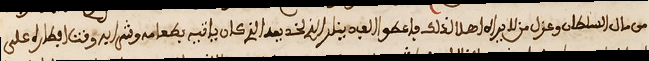من مال السلطان وعزل من لايراه اهلا لذلك فاعطوا الف دينار الذي لخديمة الذي كان ياتيه بطعامه وشرابه وقت افطاره على
